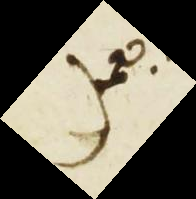يعمل
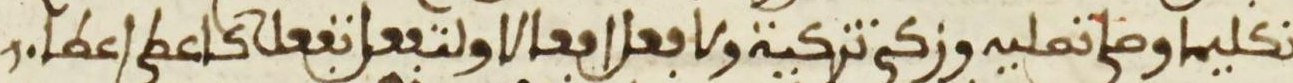تكليما و صلى تصلية و زكى تزكية و لافعل افعالا و لتفعل تفعلا كاعطى اعطاء
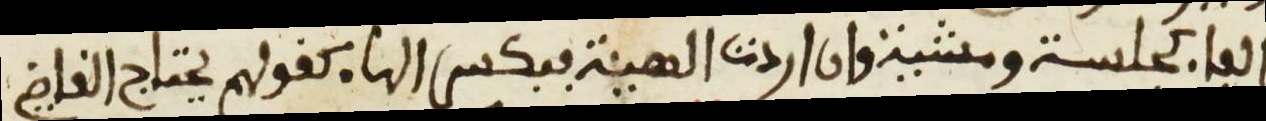الفاء كجلسة و مشية وان اردت الهينة فبكسر الهاء كقولهم يحتاج القاضي
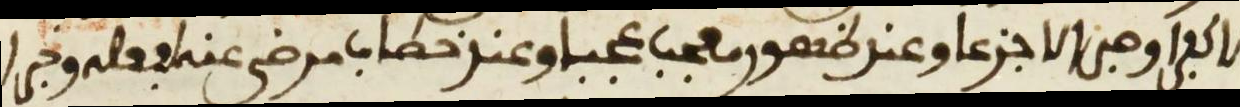لا كفرا و صبرا لا جزعا و عند ظهور معجب عجبا و عند خطاب مرضى عنما فعله و خبرا
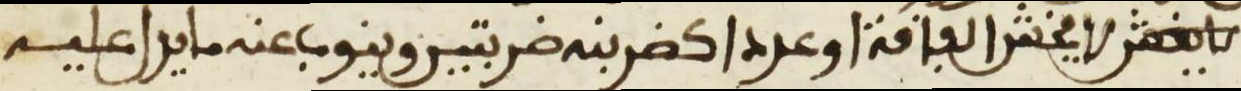لا يخش الفاقة او عددا كضربنه ضربتين و ينوب عنه ما يدل عليه
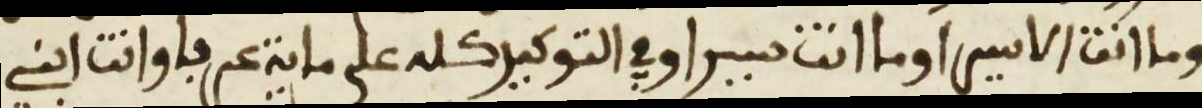و ما انت الاسير او ما انت سيرا و في التوكيد كله على ماية عرفا و ا نت ا بني
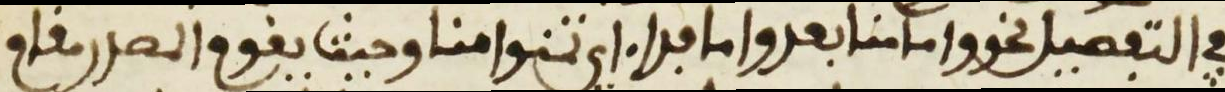في التفصيل نحو و امامنا بعد و اما فدا ءاي تمنوا منا و حيث يقوم المصدر مقام
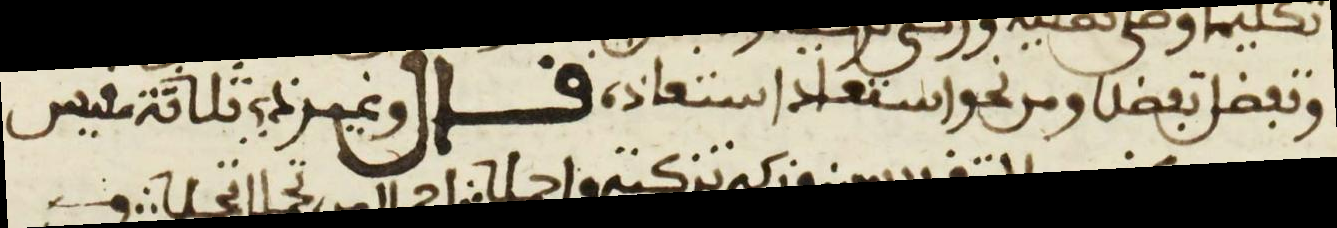و تفضل تفضلا و من نحو استعاذ استعاذه قال و غير ذي ثلاثة مقيس
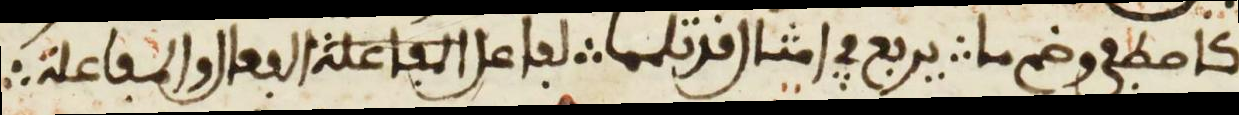كاصطفى و ضم ما يرفع في امثال قد تلمما لفاعل المفاعلة الفعال و المفاعلة
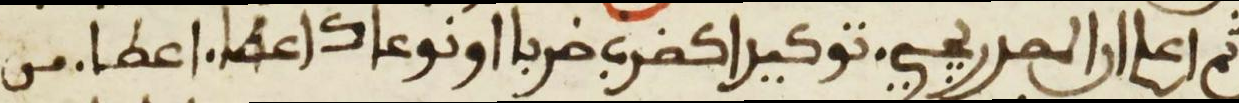ثم اعلم ان المصدر يجيء توكيدا كضرب ضربا او نوعا كاعطاء اعطاء من
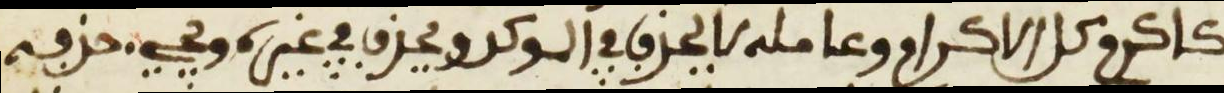كاكرم و كل الاكرام و عامله لا يحذف في الموكد و يحذف في غيره و يجيء حذفه
